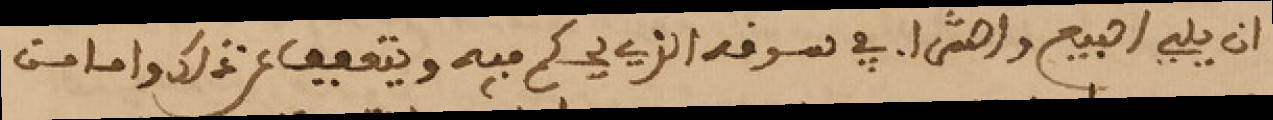ان يلي البيع والشراء في سوقه الزي يحكم فيه ويتعفف عن ذلك واما من
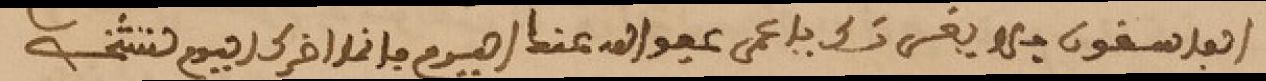الفاسقون فهو بغيرتك يا عمر عبد الله عند اليوم فانما اخرك اليوم
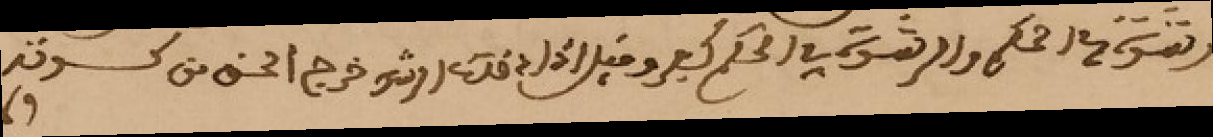رشوة # الحكم والرشوة في الحكم # وقيل اذا دفعت الرشوة خرج الحق من كسوته ولا يجوز للحاكم
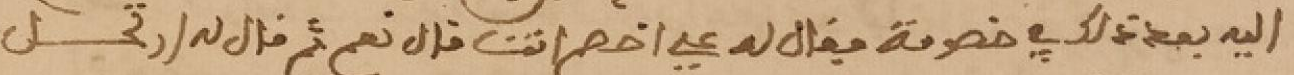اليه بعد ذلك في خصومة فيقال له علي اخصم انت قال نعم ثم قال له ارتحل
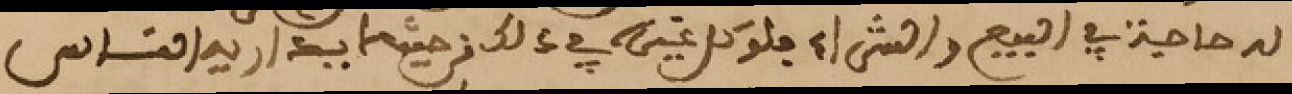له حاجة في البيع والشراء فلوكل غيره في ذلك من حيثما يداريه الناس
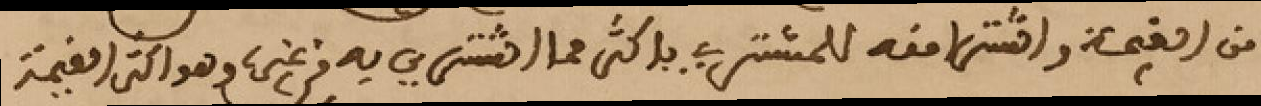من القيمة واشتراه منه للمشتري باكثر مما اشتري به من غيره وهو اكثر القيمة
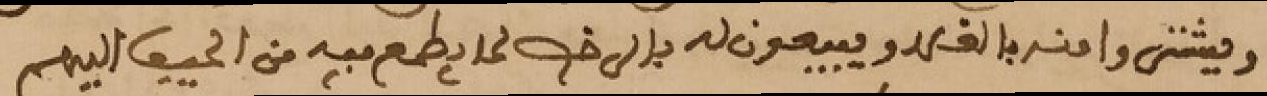ويشتروا منه بالغرر ويبيعون له بالرخص لما يطمع فيه من الحيف اليهم
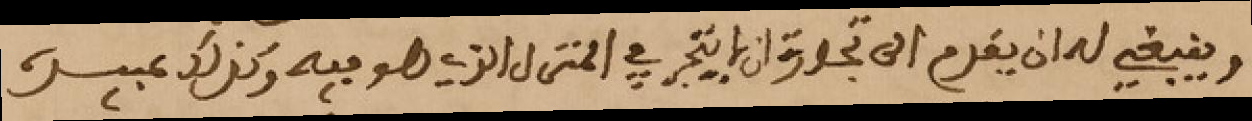وينبغي له ان يقدم الى تجارة ان لا يتجر في المنزل الذي هو فيه وكذلك عبيده
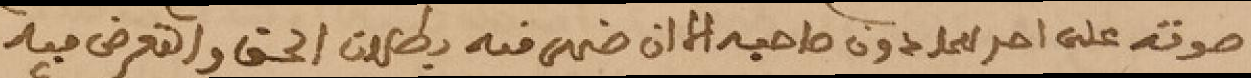صوته على احدهما دون صاحبه الا ان ظهر منه بطلان الحق والتعرض فيه
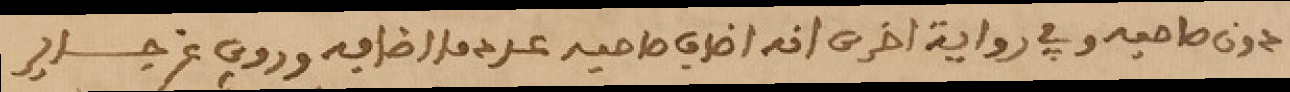دون صاحبه وفي رواية اخرى انه اضاف صاحبه عدد ما اضافه وروي عن جابر
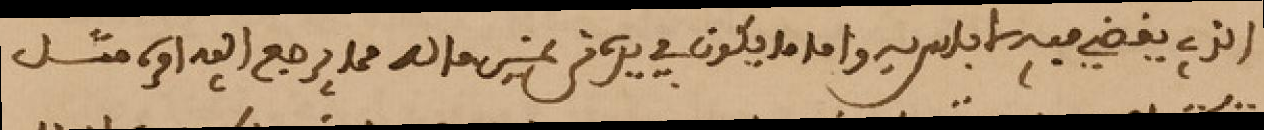الذي يقضي فيه لا باس به واما ما يكون في يده من غير ماله مما يرجع اليه امره مثل
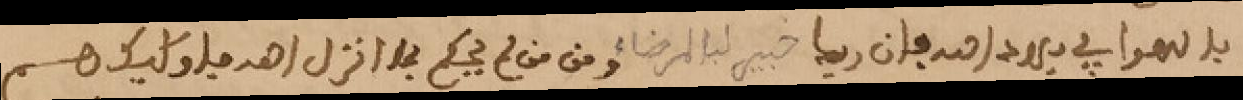بالهوا في بلاد الله فان ربا خبير بالمراض ومن من لم يحكم بما انزل الله فاوليك هم
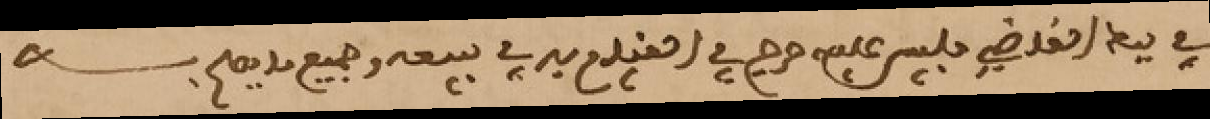في يد القاضي فليس عليه حرج في القيام به في بيعه وجميع ما يصلح به
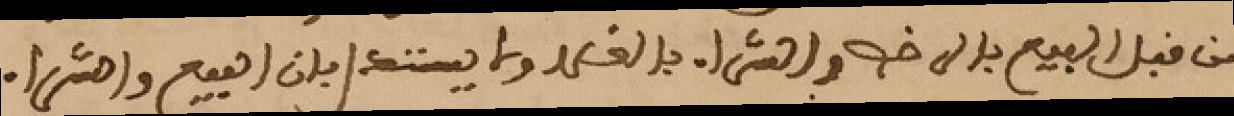من قبل البيع بالرخص والشراء بالغرر ولا يستدل بان البيع والشراء
